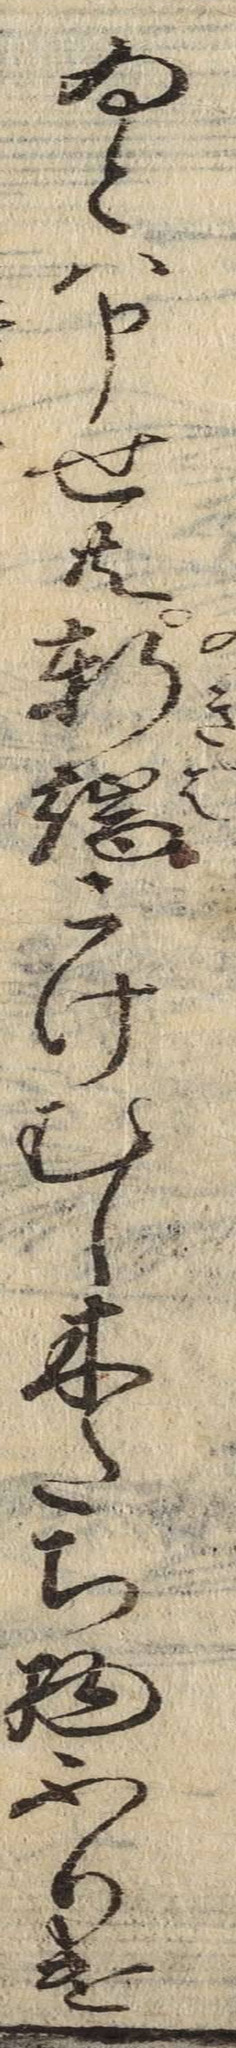ゐとは申せ共。軒端こけむし木たち物ふりけ
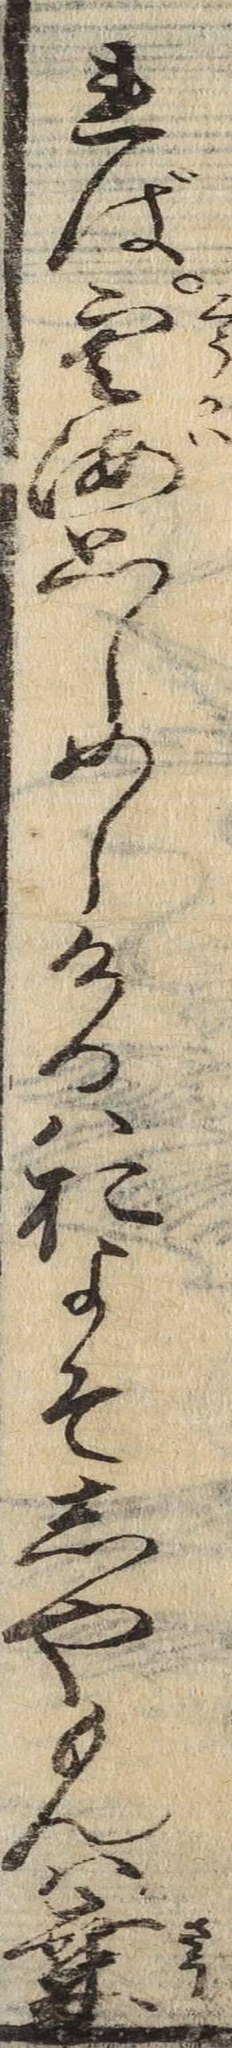れば。空海思しめしけるはおよそしやもんは桑
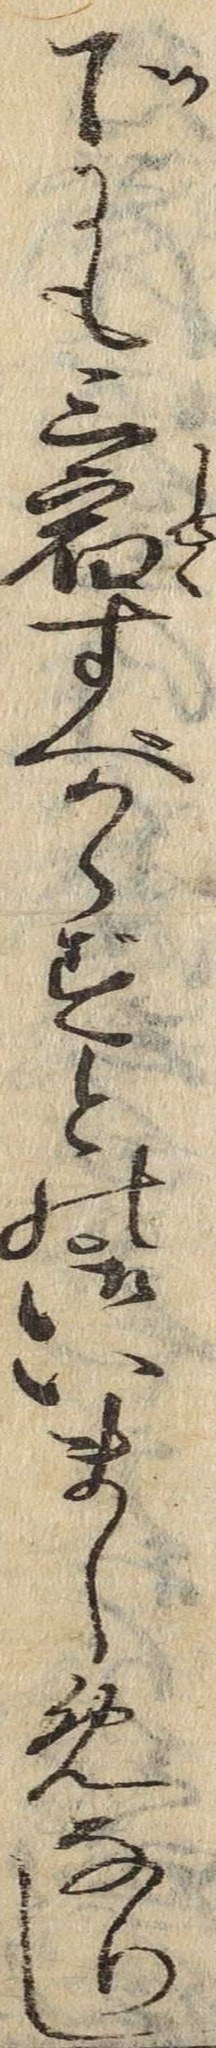下にも三宿すべからずとの。御いましめなりし
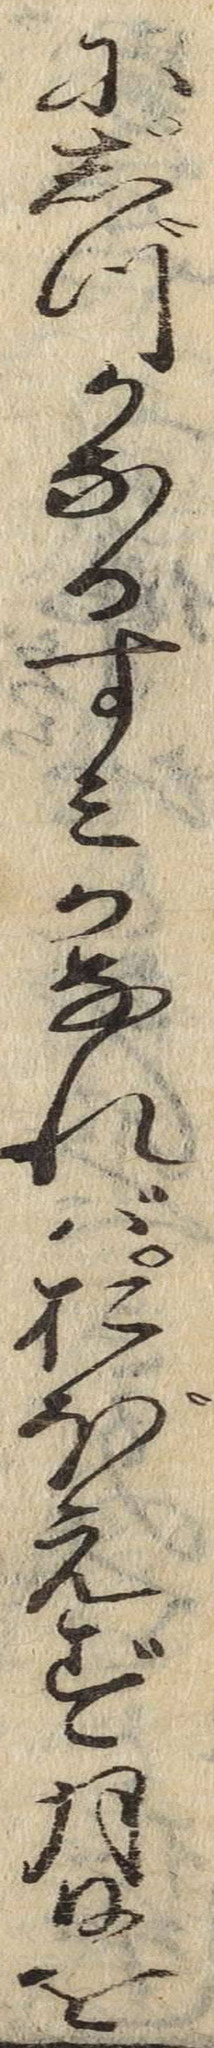に。しづかなるすみかなれば。おぼえず月日を
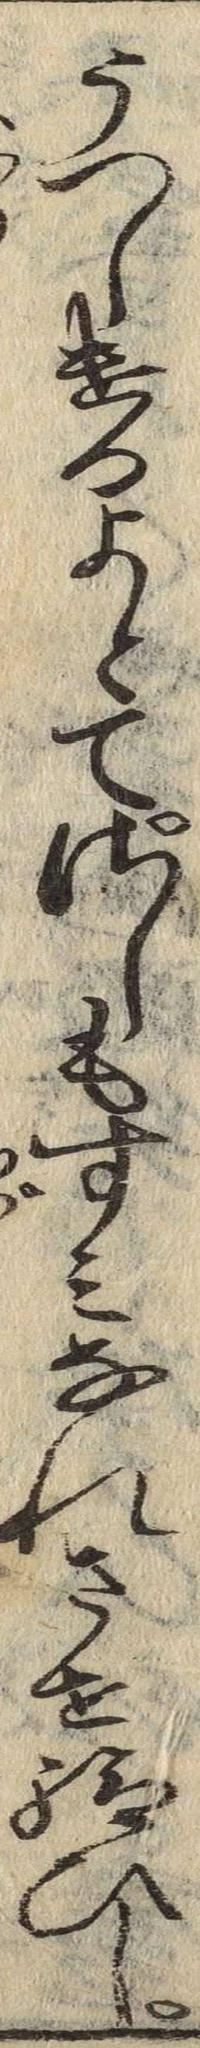うつしけるよとて。さしもすみなれさせ給ひし。
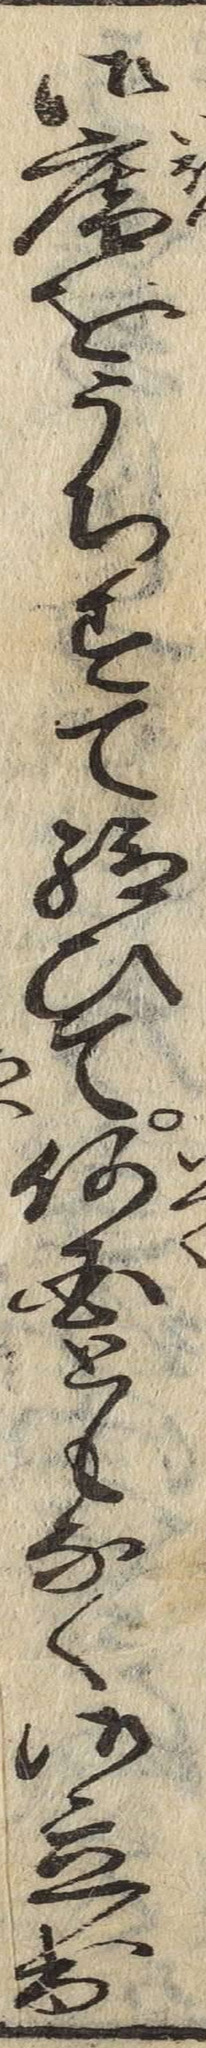御庵をうちすて給ひて。何国ともなく御立出
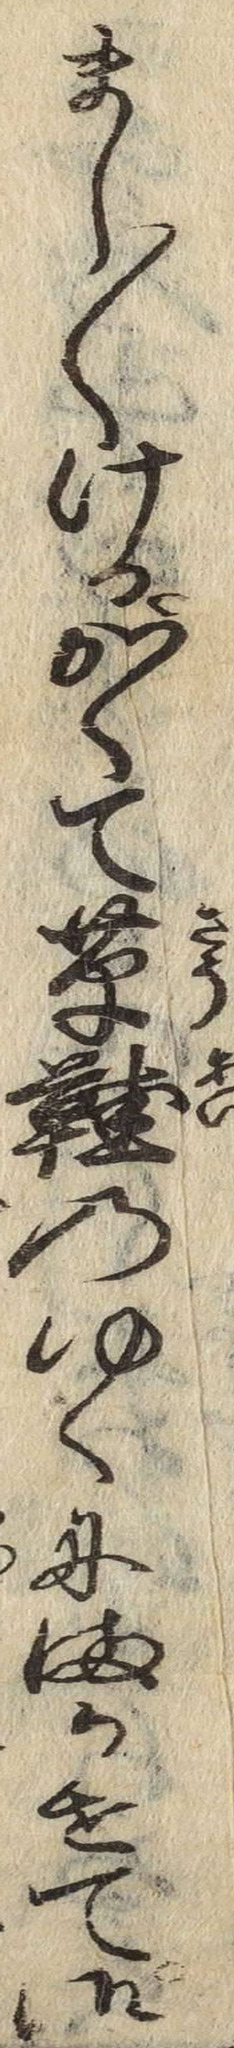まし〳〵ける。かくて草鞋のゆくにまかせて。御
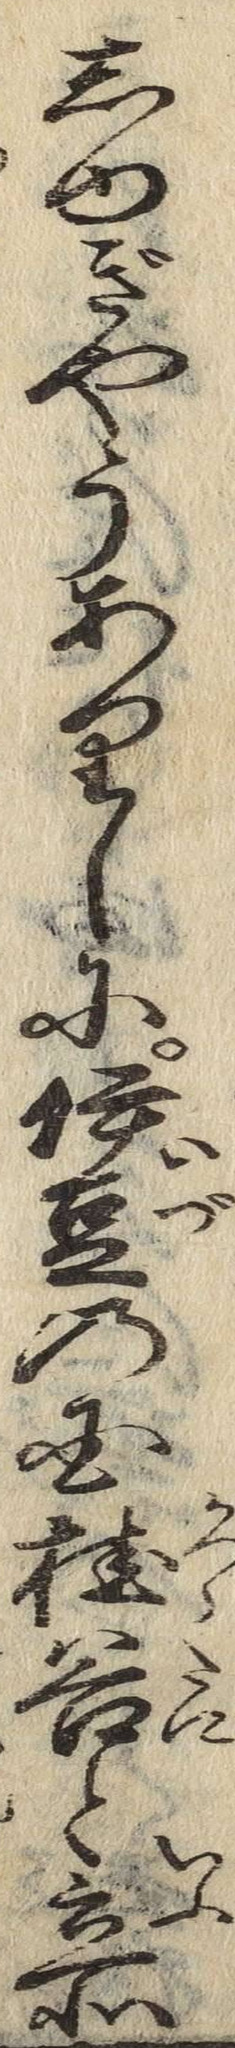しゆぎやうありしに。伊豆の国桂谷と云所
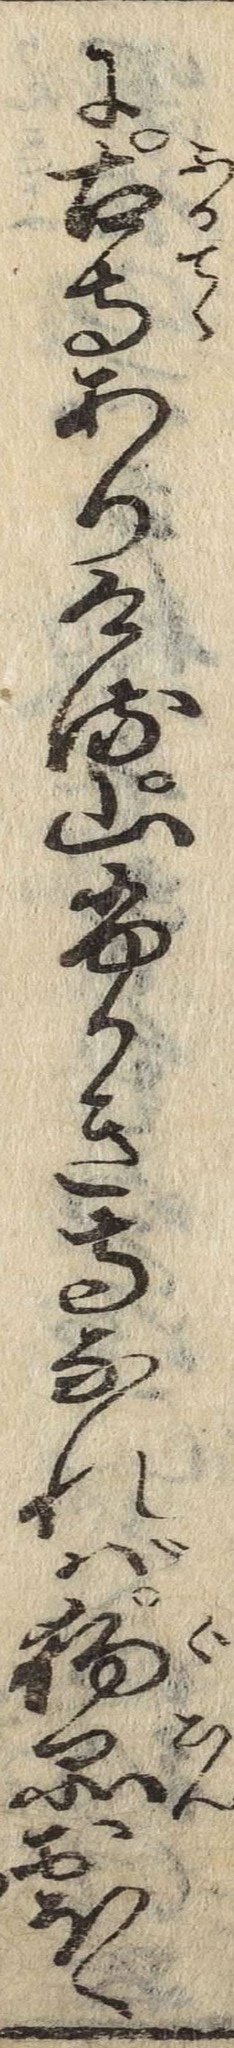に古寺ありける。山たかき寺なれば。狗品おほく
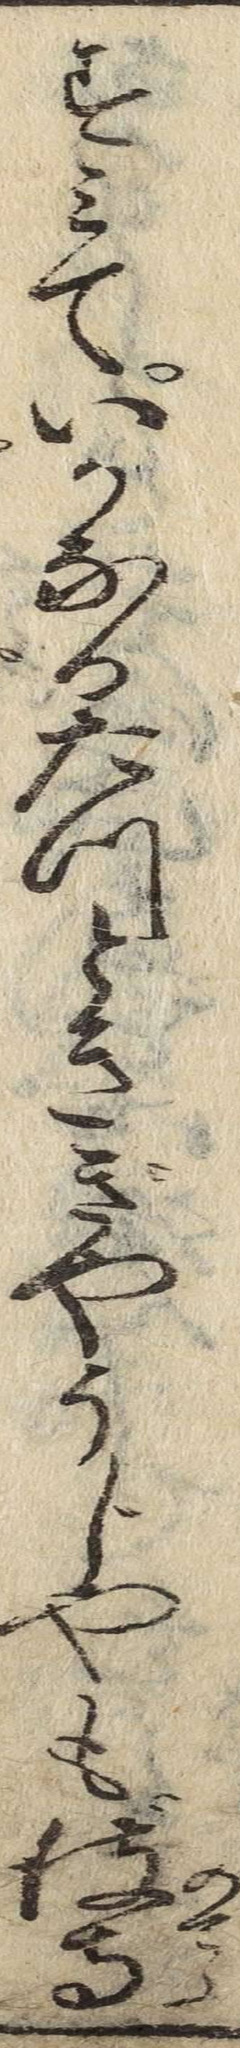すみて。いかなるたつときぎやうじやも彼寺
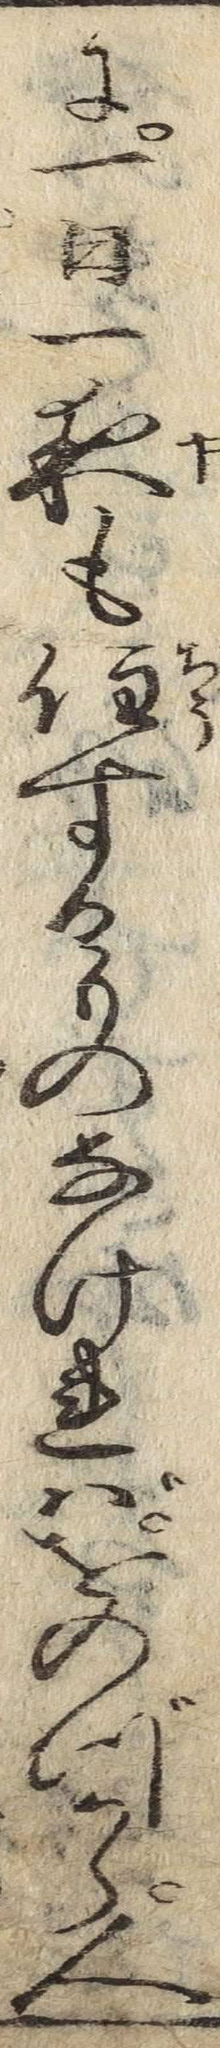に。一日一夜も住するものなければ。おのづから。人
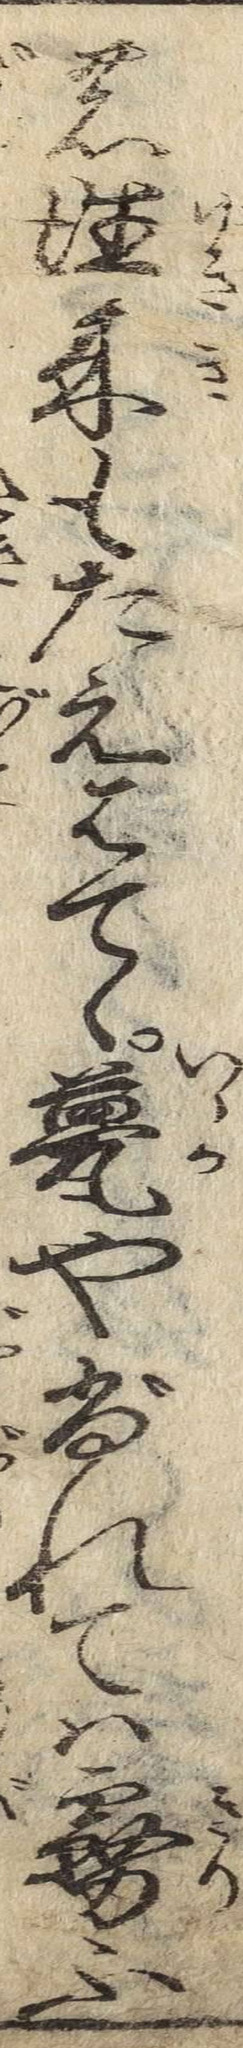の往来もたえはてゝ。甍やぶれては霧ふ
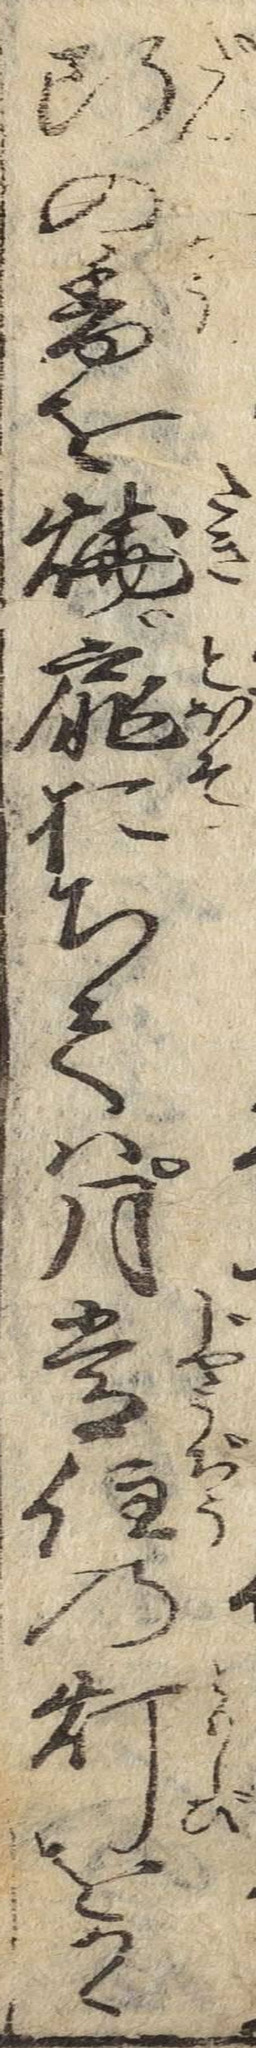断の香を焼。扉おちては。月常住の灯をかゝ

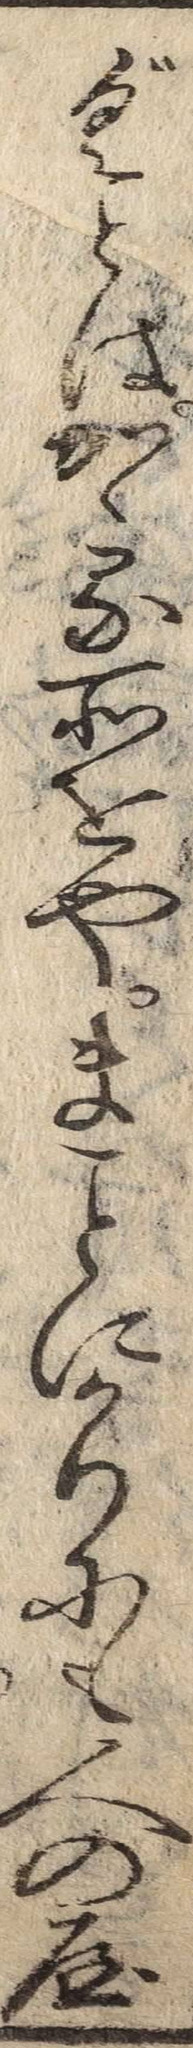ぐとは。かゝる所をや。まことにかりにも人のや
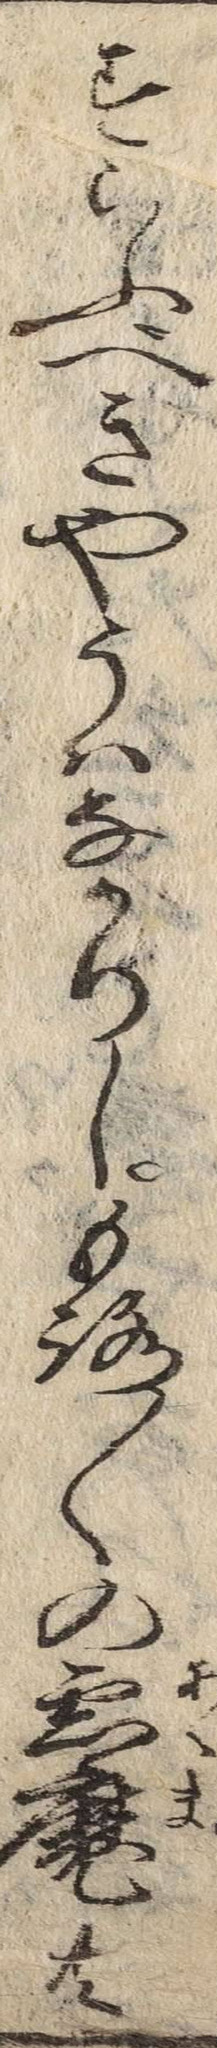すらふべきやうはなかりし。もろ〳〵の悪魔共
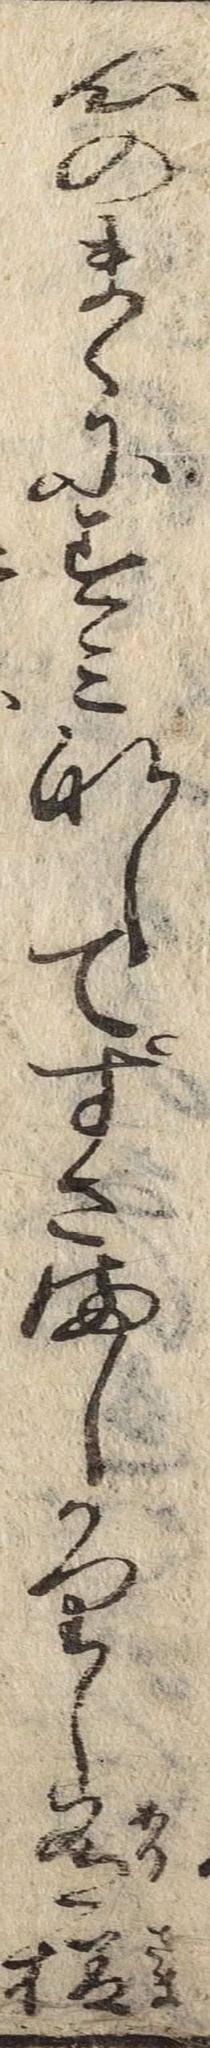心のまゝにすみなして。すさましかりし有様
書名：弘法大師御傳記
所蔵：京都府立京都学・歴彩館 国文学研究資料館
